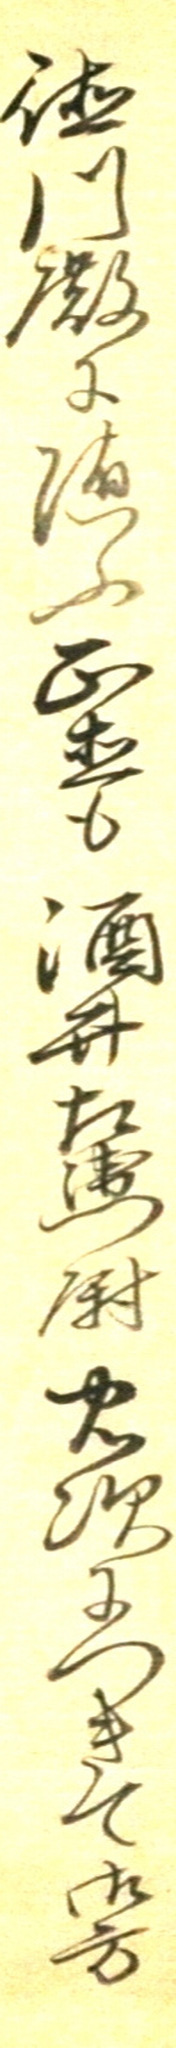徳川殿に随ふ正直も酒井左衛門尉忠次につきて御方
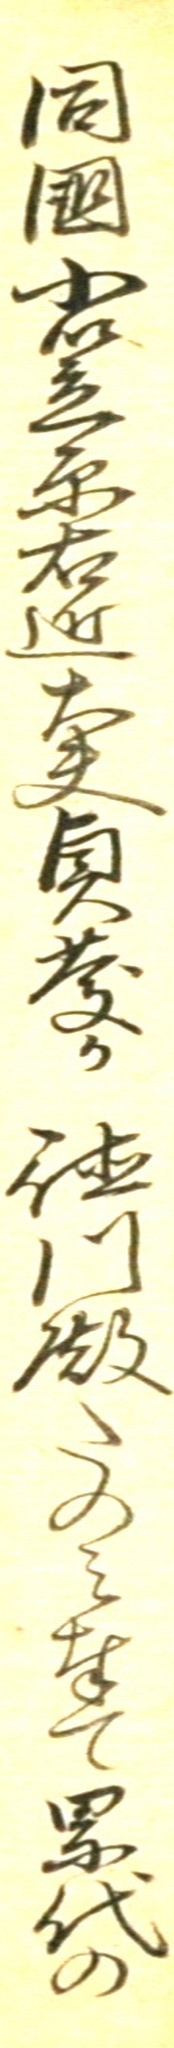同国小笠原右近大夫貞慶か徳川殿たのみ奉て累代の
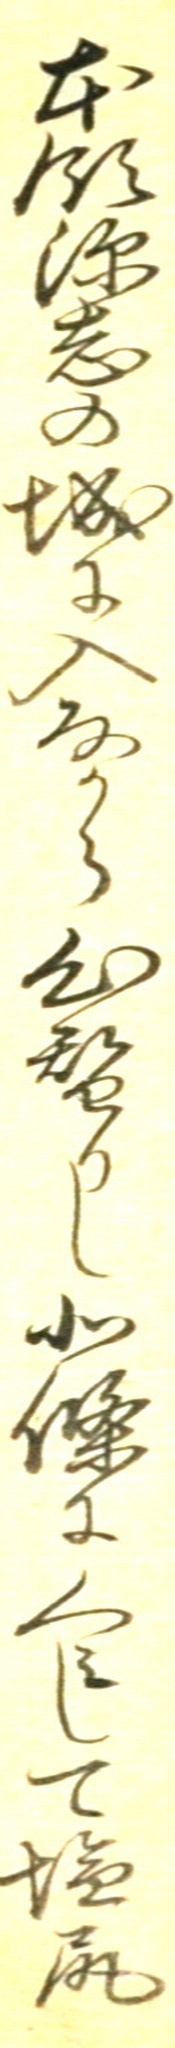本領深志の城に入なから心替りし北条にくみして塩尻
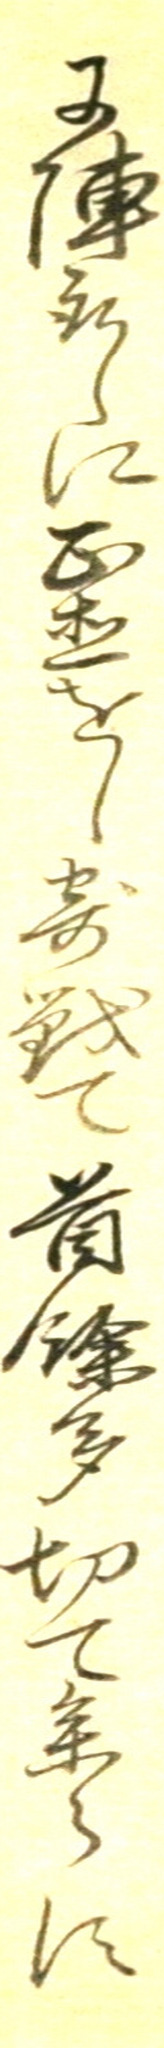に陣取しに正直をし寄戦て首余多切て参らす
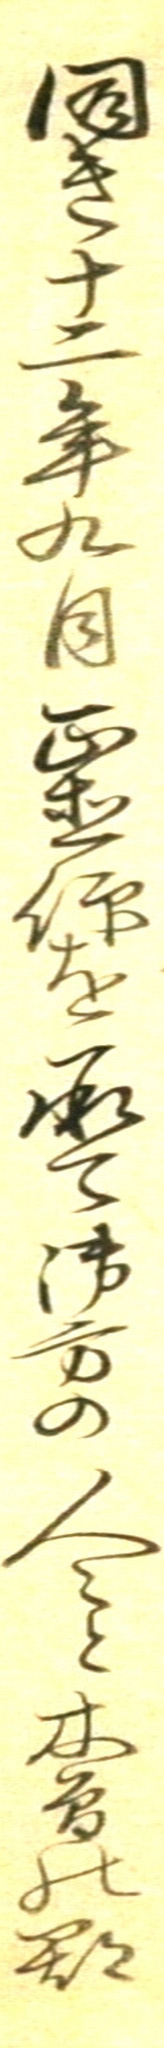同き十二年九月正直仰を承て御方の人々と木曽の郡
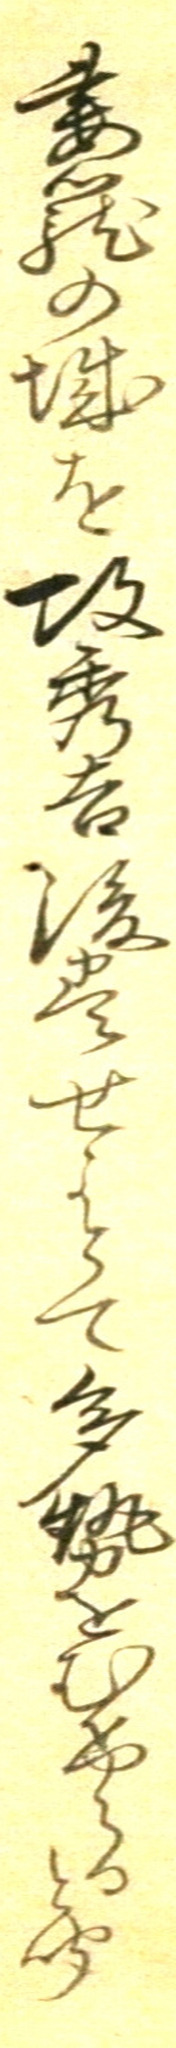妻籠の城を攻秀吉後番せよとて多勢をむけらると聞
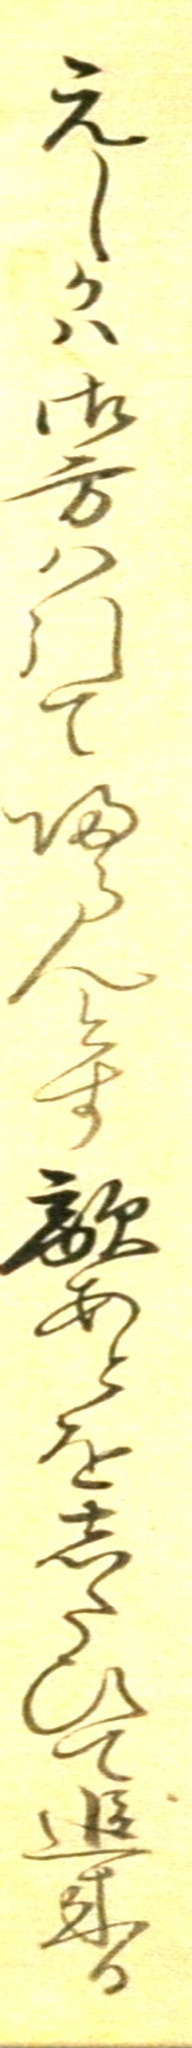えしかは御方は引て帰らんとす敵あとをしたひて進来る
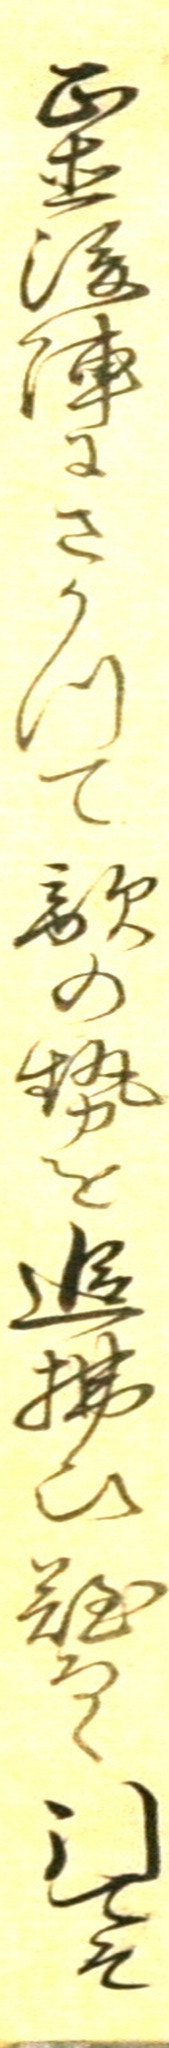正直後陣にさかつて敵の勢を追払ひ難なく引てそ

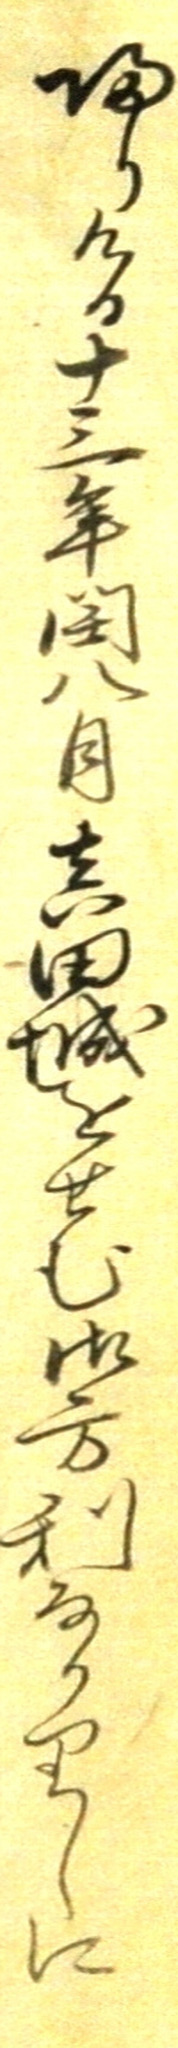帰りける十三年閏八月真田城をせむ御方利なかりしに
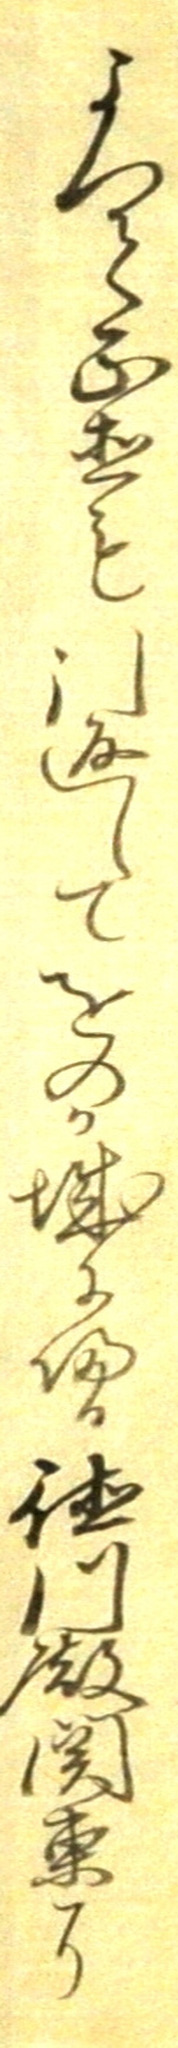よつて正直も引返してをのか城に帰る徳川殿関東に
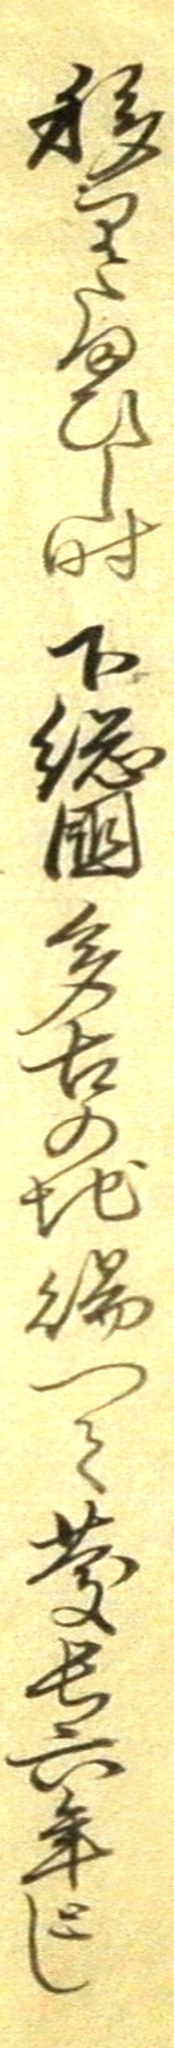移りたまひし時下総国多古の地賜つて慶長六年とし
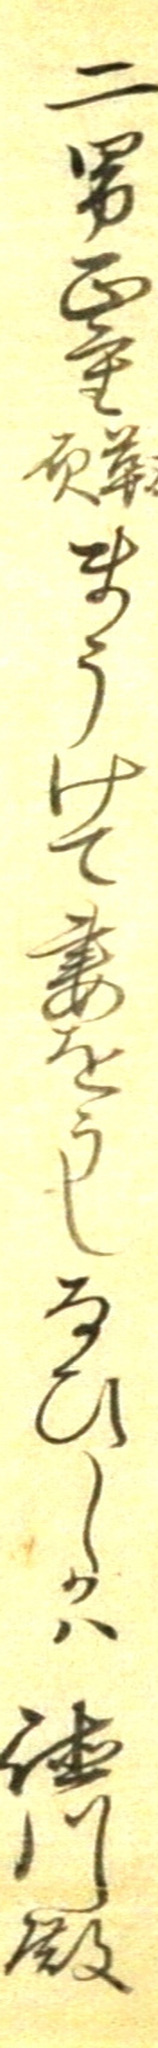二男正重靭負まうけて妻をうしなひしかは徳川殿
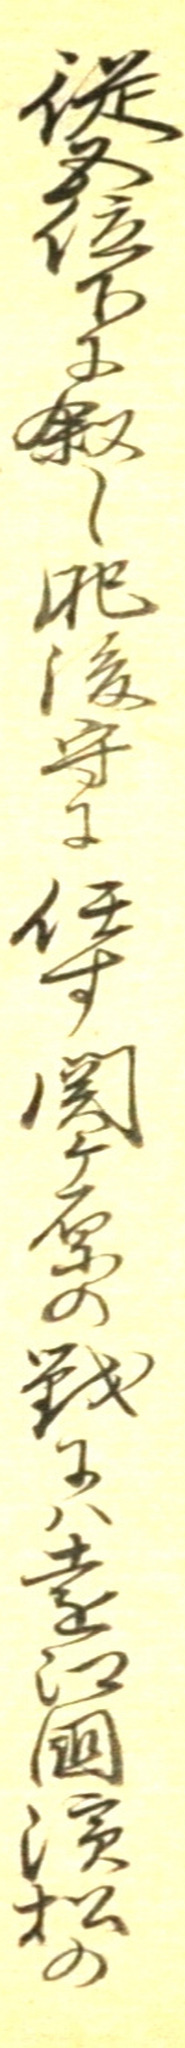従五位下に叙し肥後守に任す関ヶ原の戦には遠江国浜松の
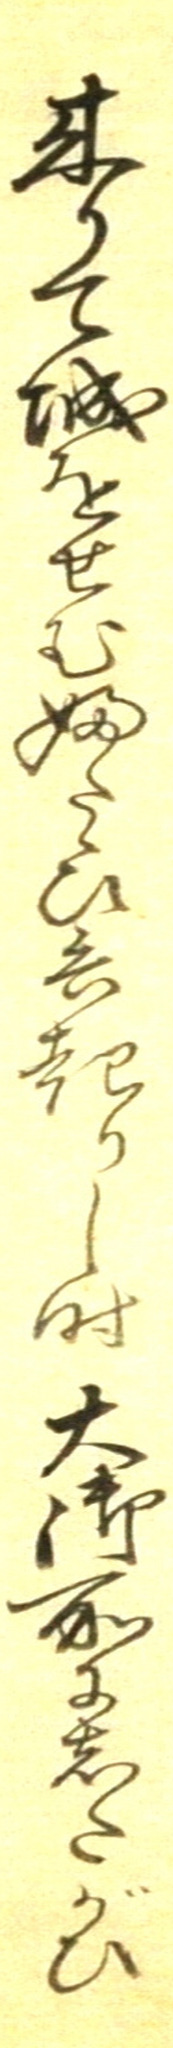来りて城をせむふたゝひ兵起りし時大御所にしたがひ
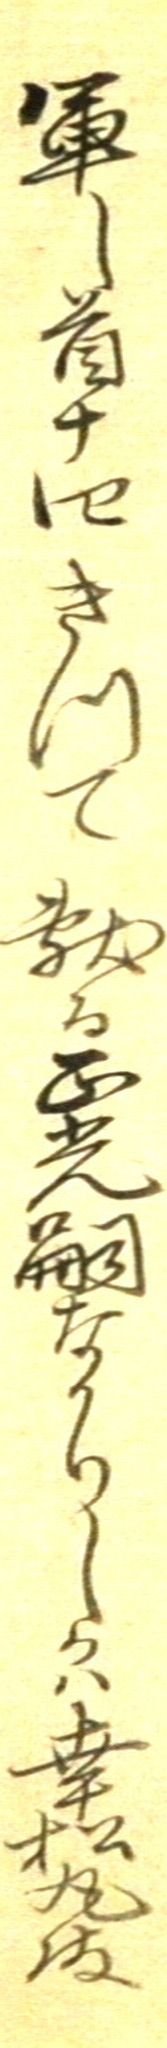軍し首十四きつて献る正光嗣なかりしかは幸松丸殿

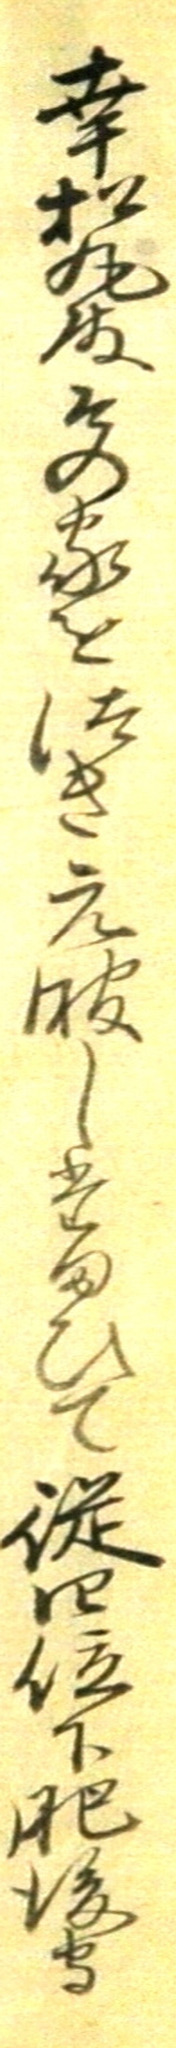幸松丸殿その家をつき元服したまひて従四位下肥後守
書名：藩翰譜（一）
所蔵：伊那市立高遠町図書館・合同会社AMANE
